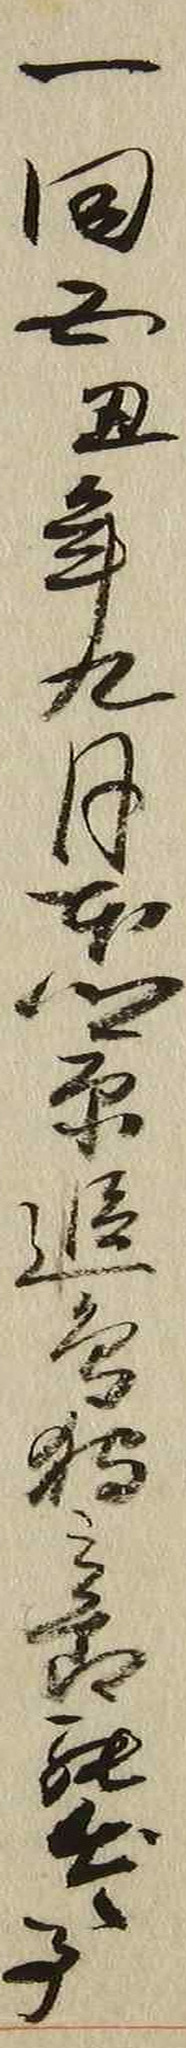一同五丑年九月本郷原追鳥狩之節罷出候事
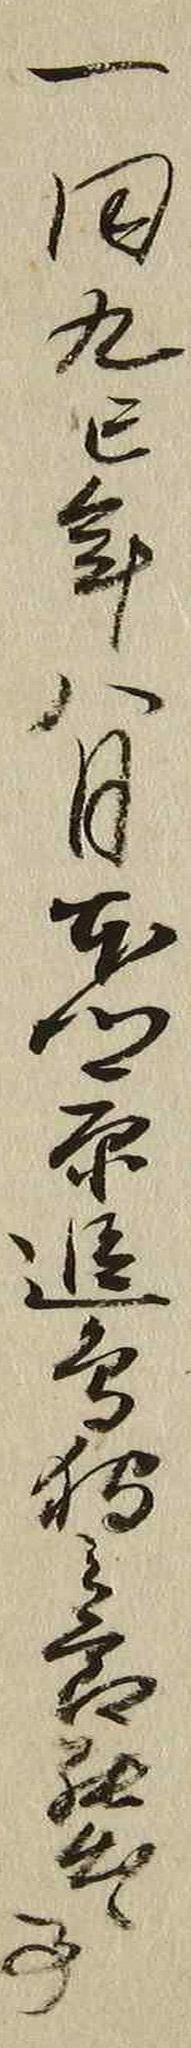一同九巳年八月本郷原追鳥狩之節罷出候事
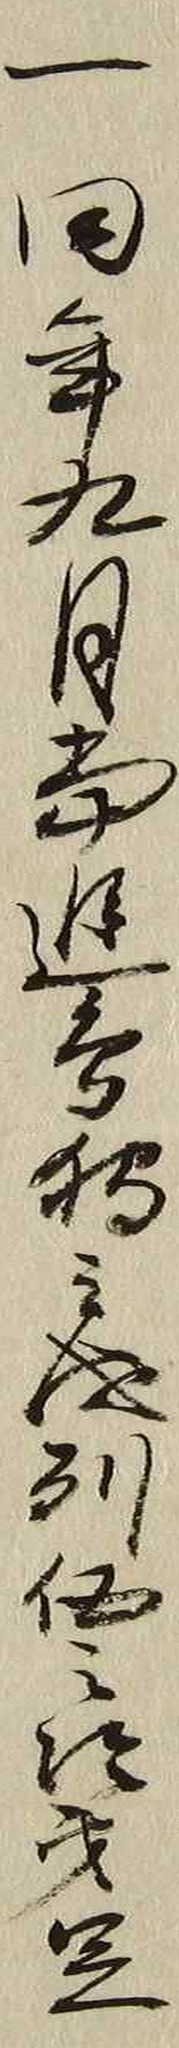一同年九月当追鳥狩之義列伍之次第足
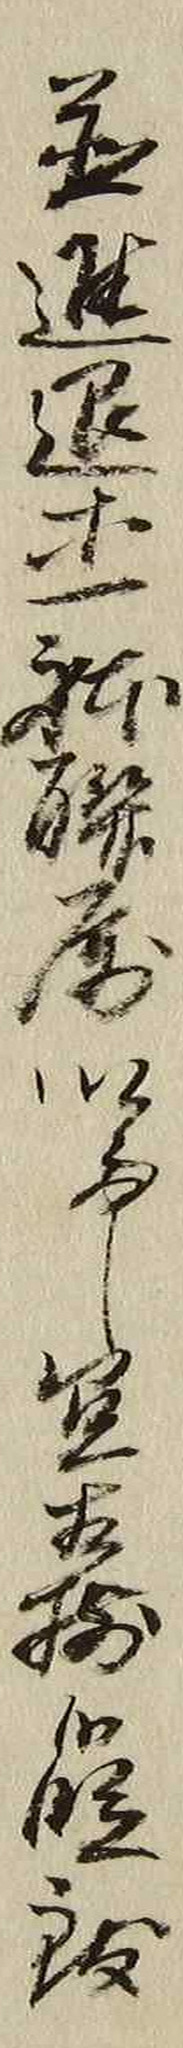並進退等一体聯属いたし宜相揃候段致
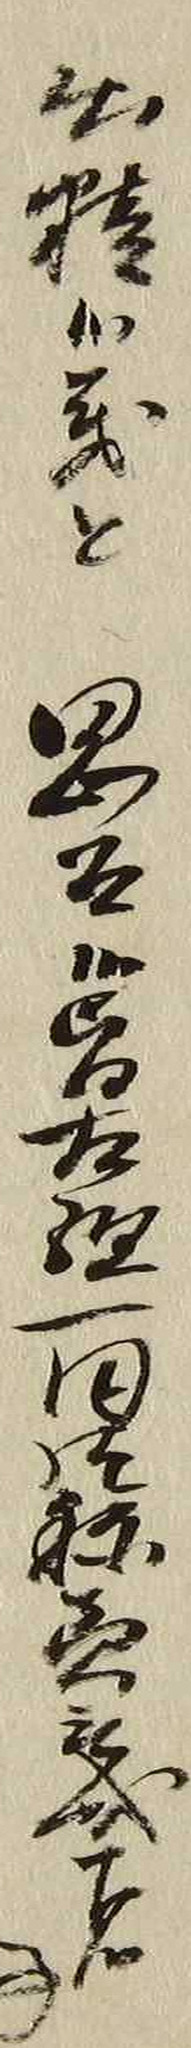出精候義と思召候旨相組一同御称美被成下候事
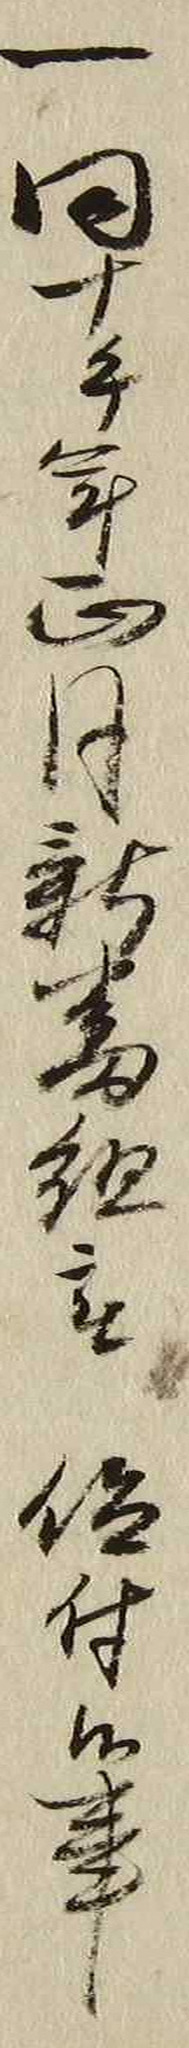一同十午年正月新番組被仰付候事
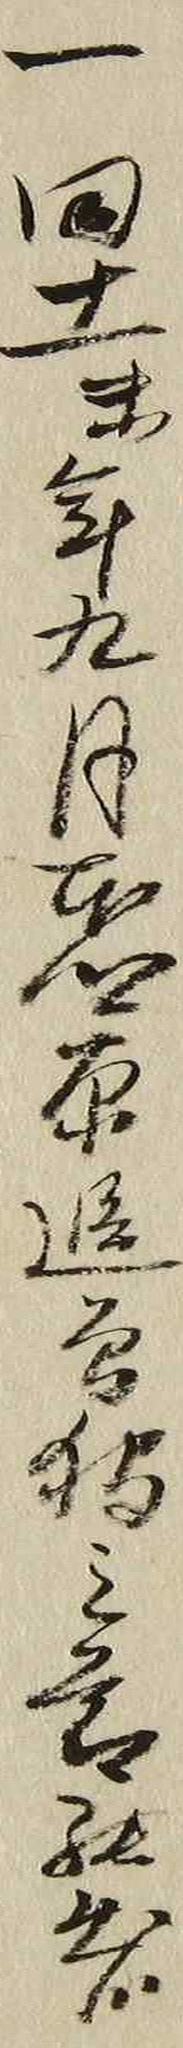一同十一未年九月本郷原追鳥狩之節罷出候
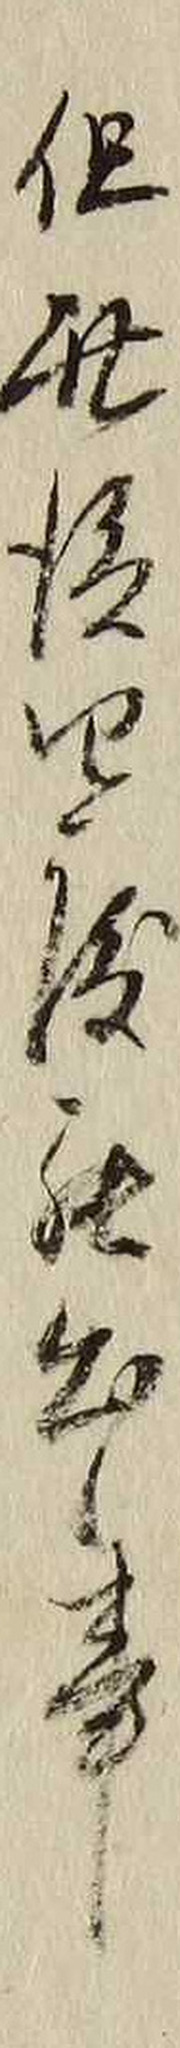但此後四度罷出候事
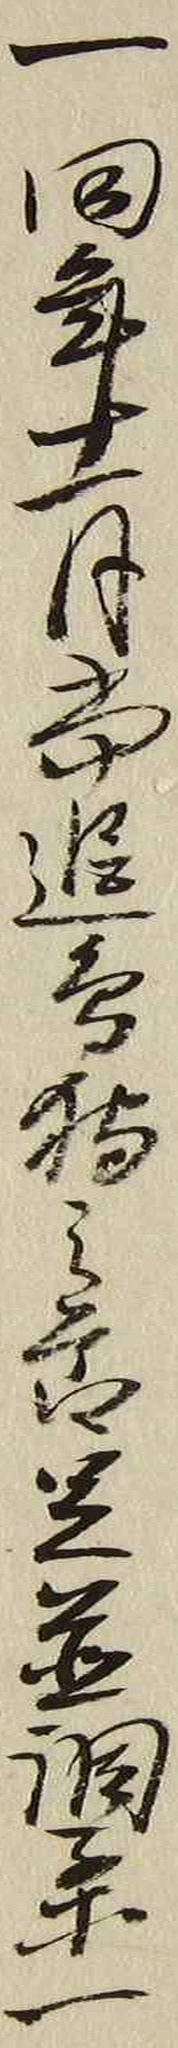一同年十一月当追鳥狩之節足並調子等一
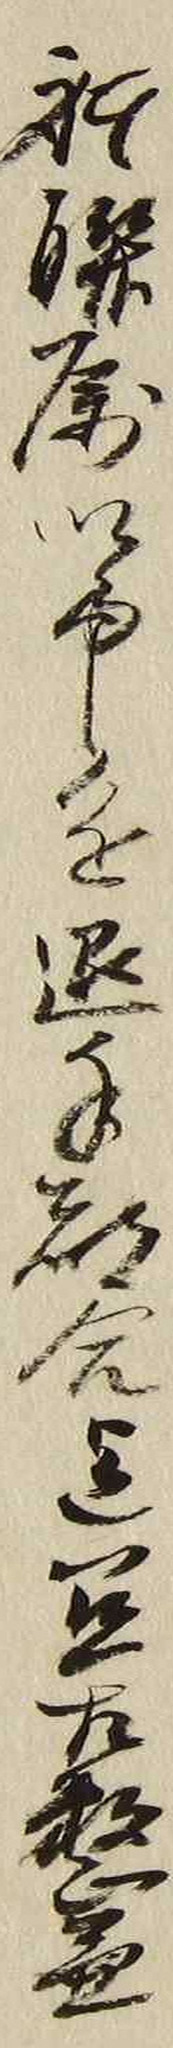体聯属いたし進退手都合迄宜相整兼
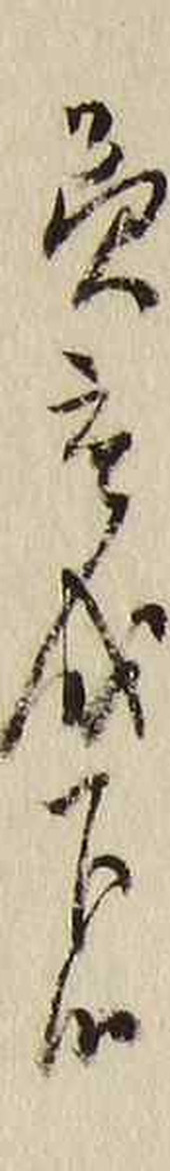美被成下候

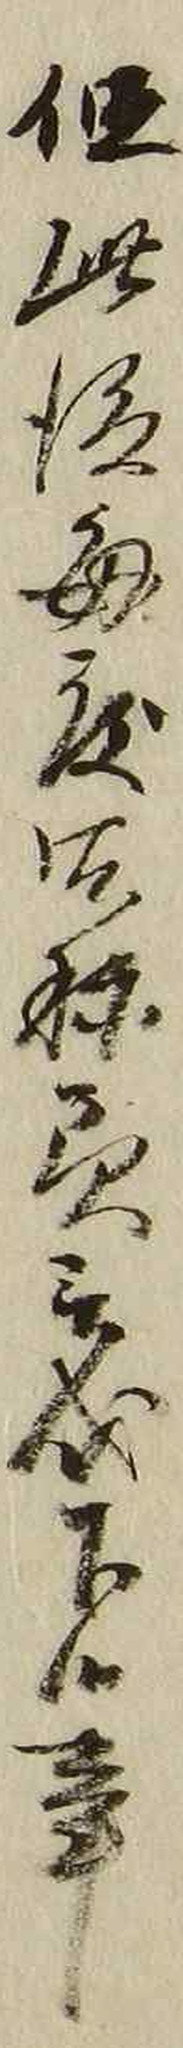但此後毎度御称美被成下候事
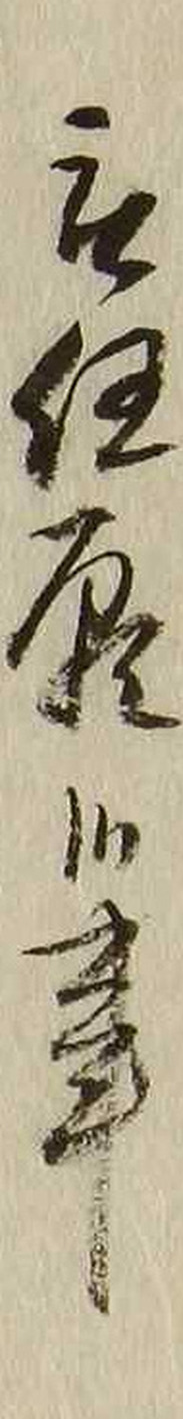被任願候事
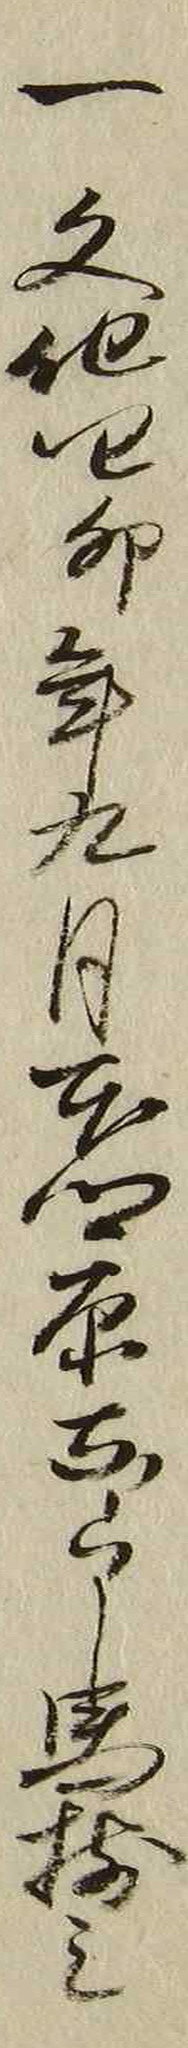一文化四卯年九月本郷原ならし馬揃之
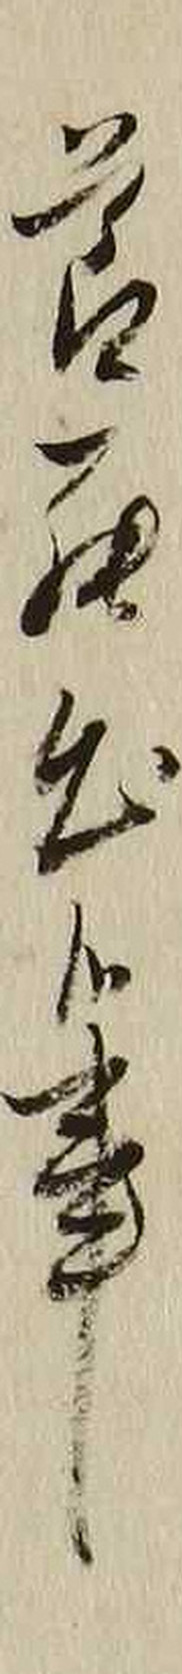節罷出候事
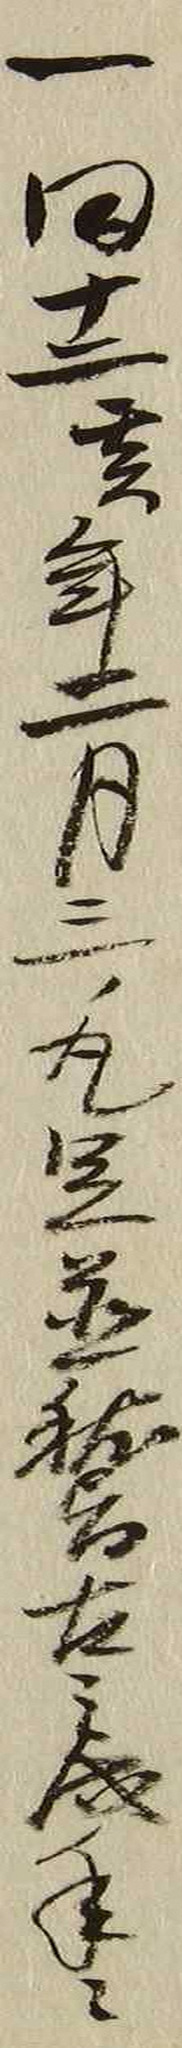一同十二亥年二月三丸足並稽古之義年々
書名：諸士系譜　巻之350　せ之部1冊全
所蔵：会津若松市立会津図書館
